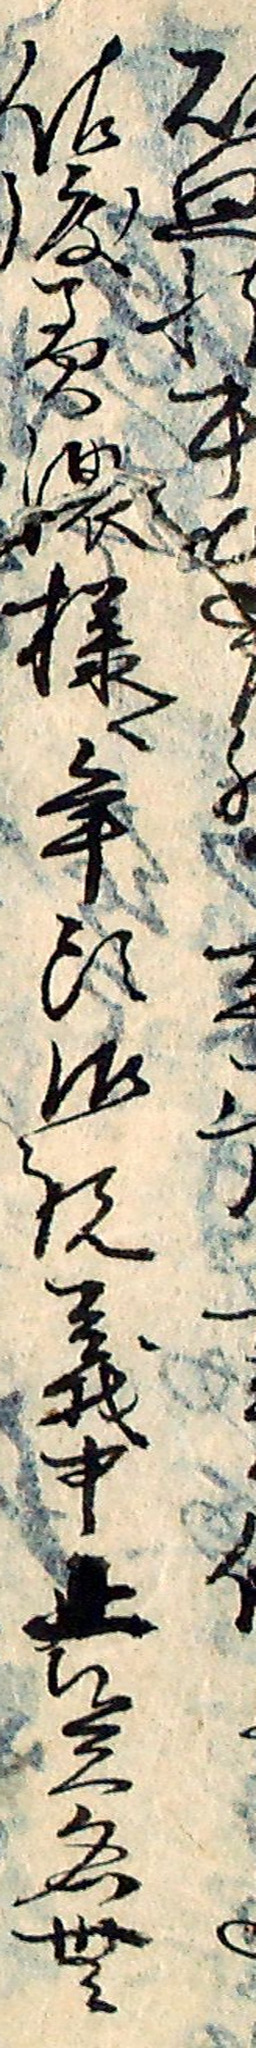佐渡美濃様へ年頭御祝義申上度各無
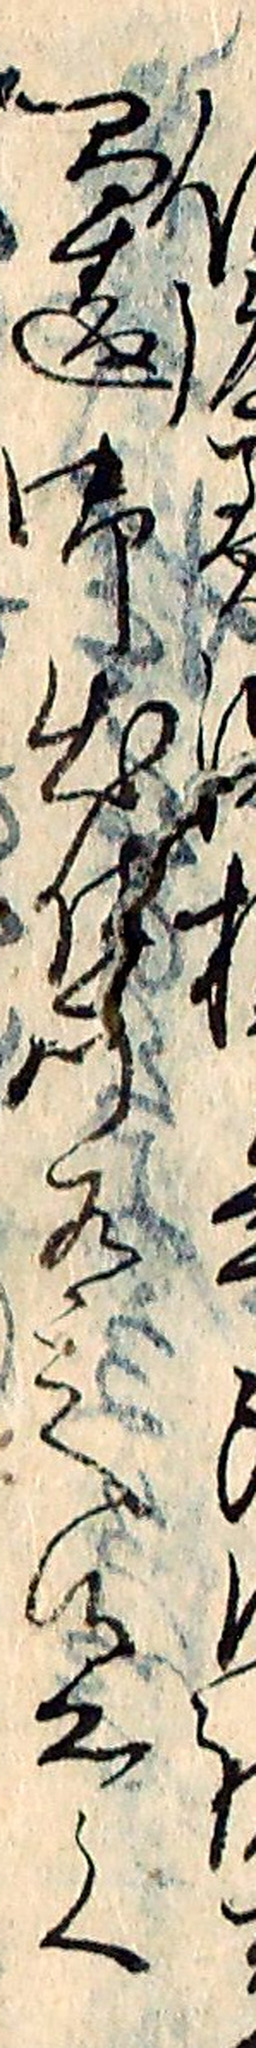間違御出仕可有之候以上
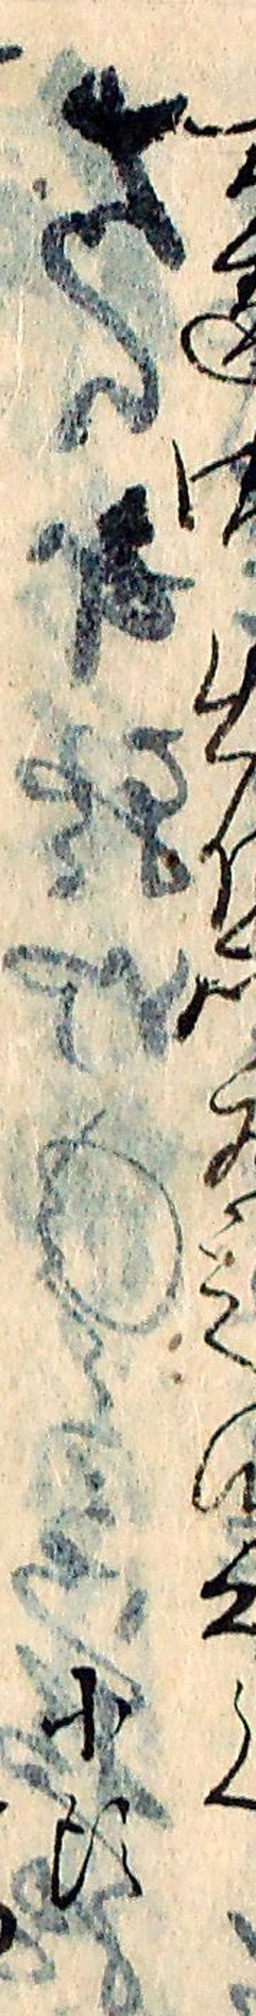十二月五日
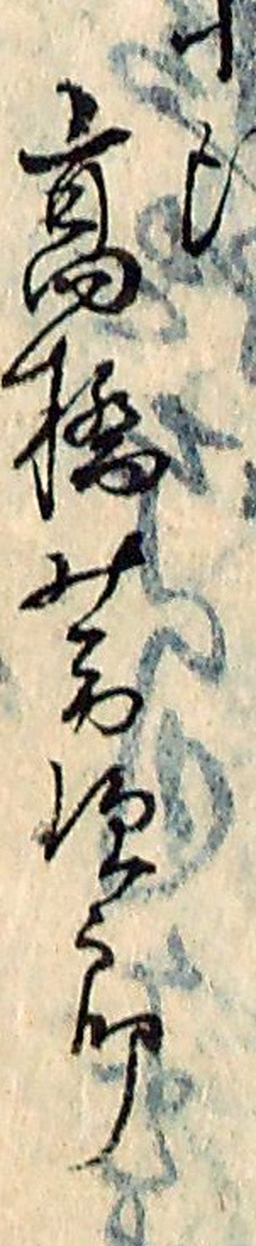高橋芳次郎
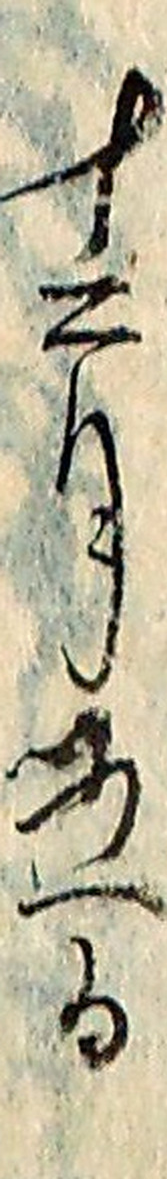十二月五日
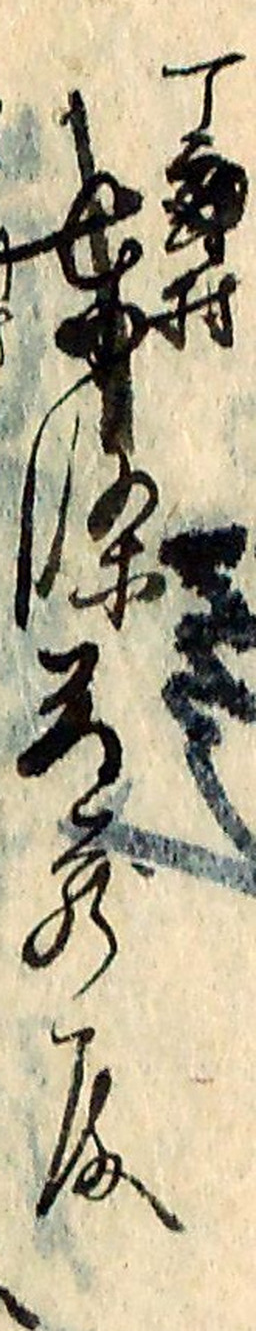東条万蔵殿
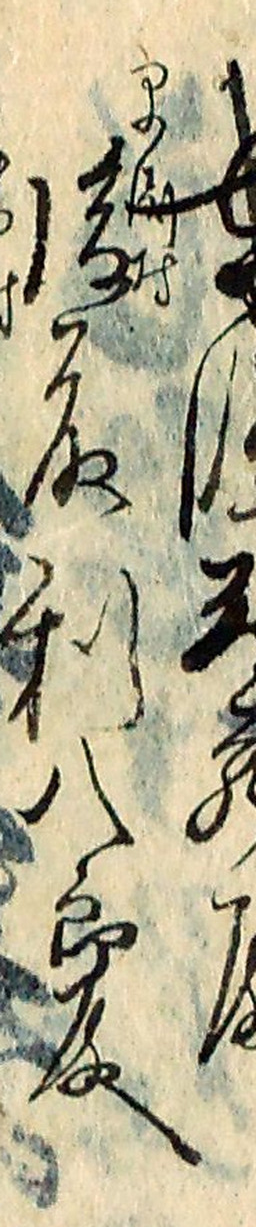後藤利八郎殿
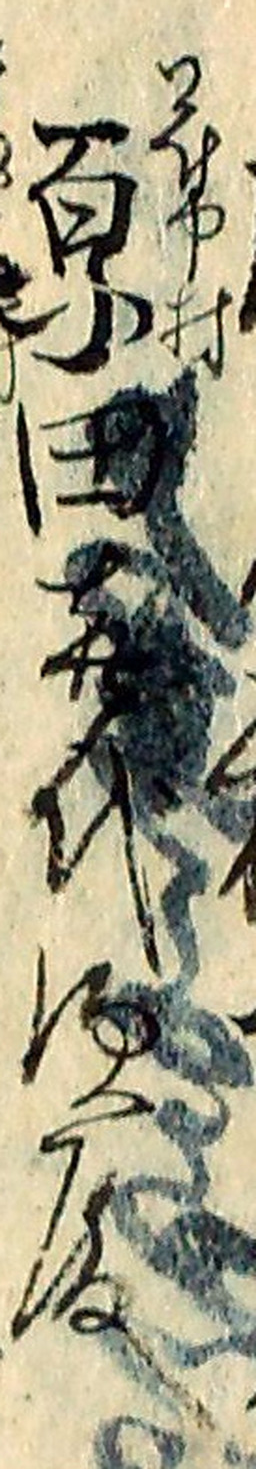原田喜代次殿
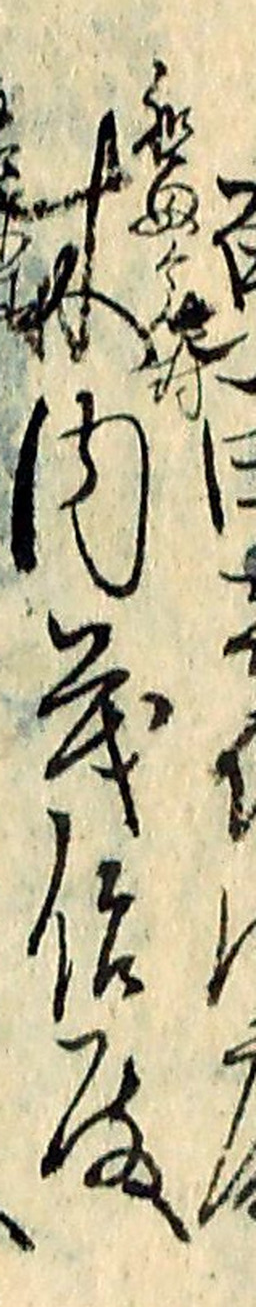木内茂作殿
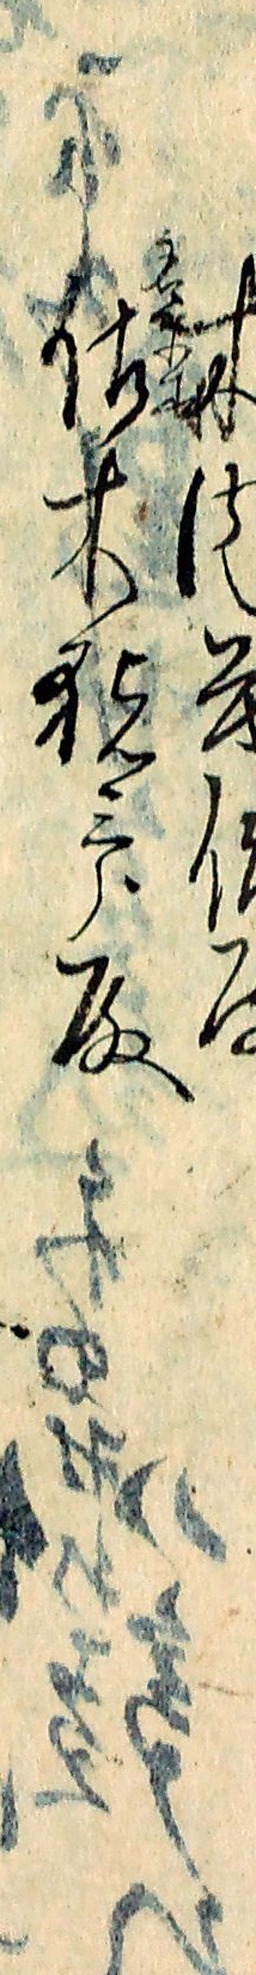佐木猪三郎殿
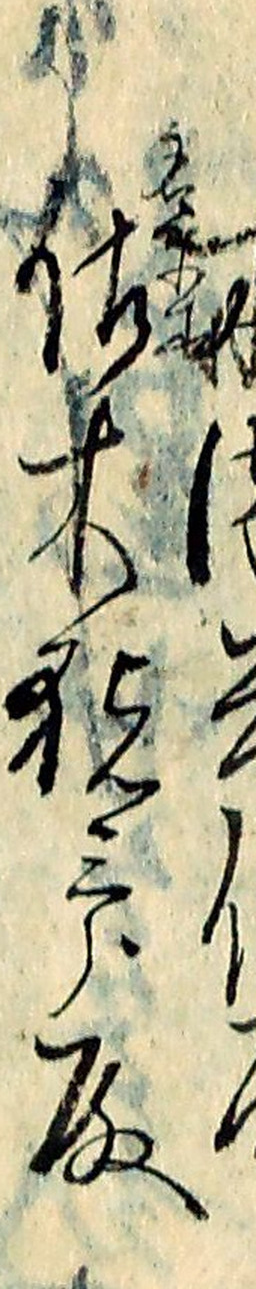佐木猪三郎殿
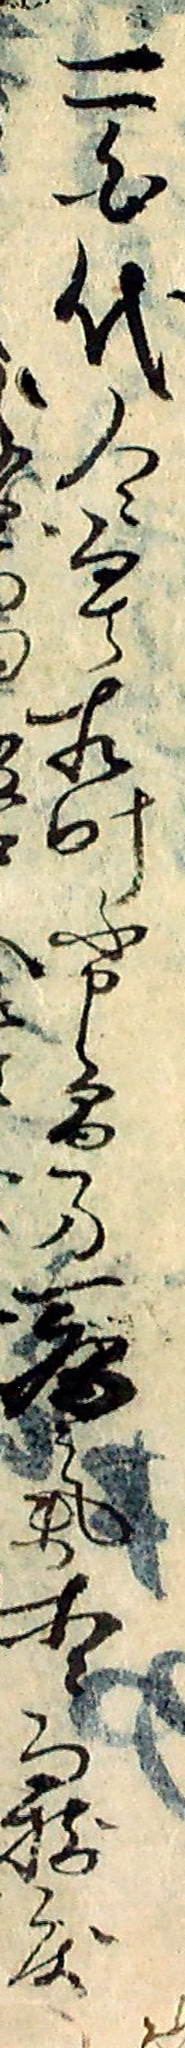二白代人にては相叶不申間万一病気等にて揃度
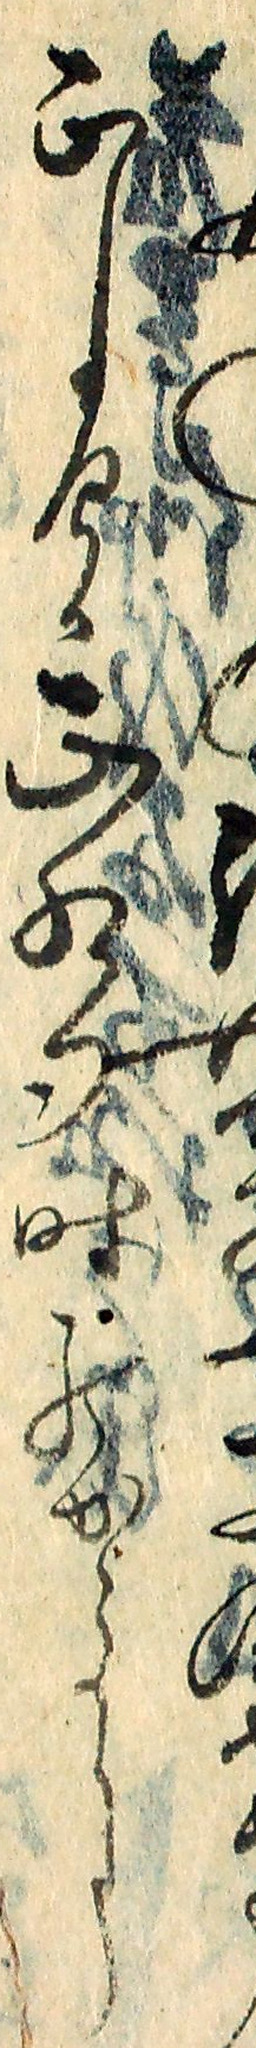正月四日正九つ時罷出可被下候

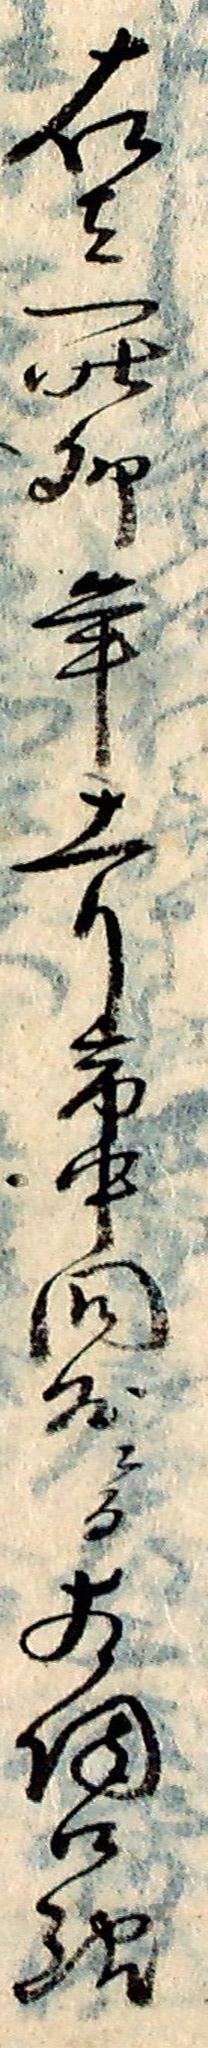右は一昨卯年十一月市中問屋にて相調口銀
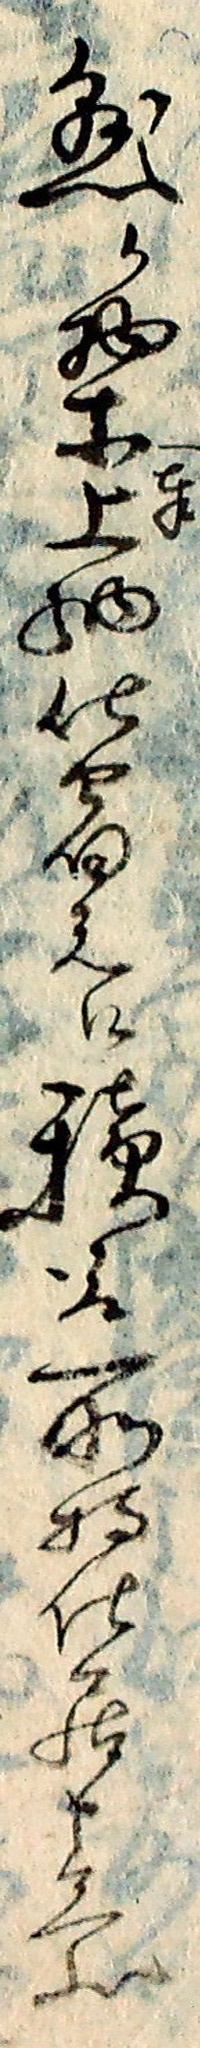懸り物等奉上納仕宿元え積取所持仕居申候所
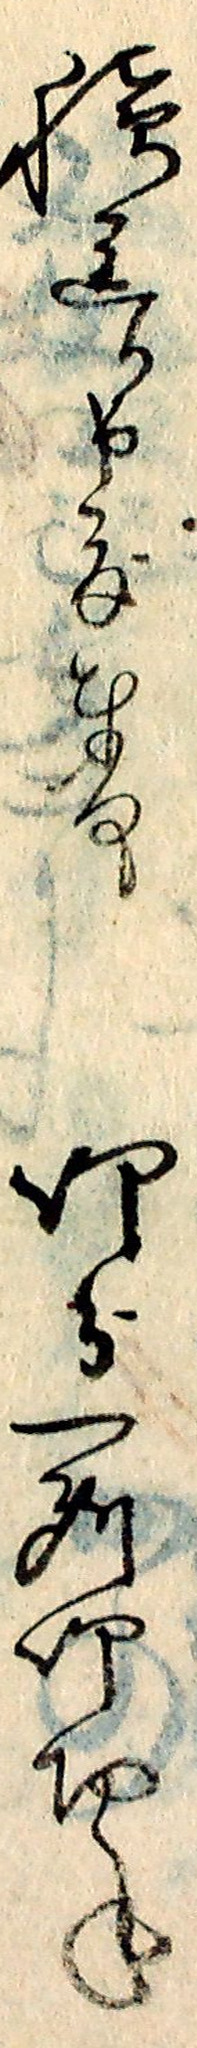積送り申度奉存候何分一所御切手
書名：諸御願書控(後藤氏壱番）
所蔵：鳴門教育大学 Naruto University of Education
